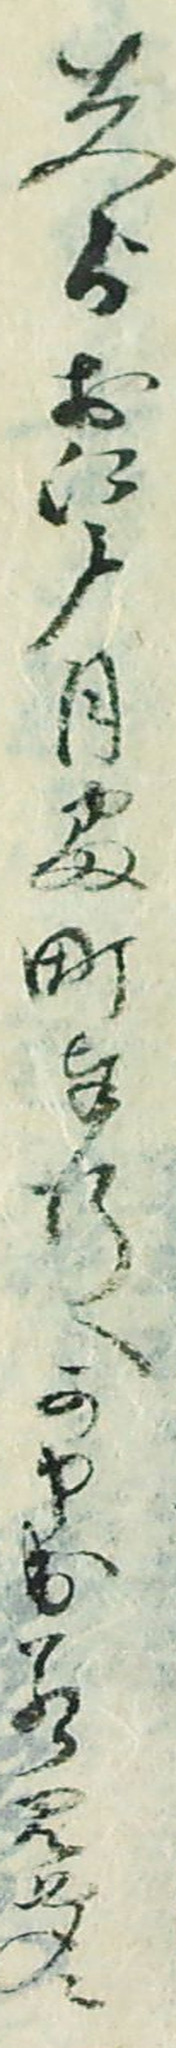先ゟ於江戸月番町奉行へ可申出若見聞に
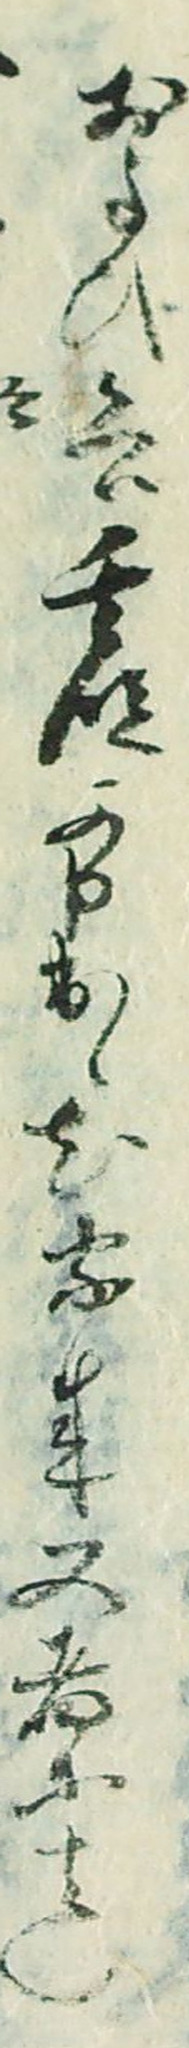およひ候へは其段可申出候尤家来又者等迄
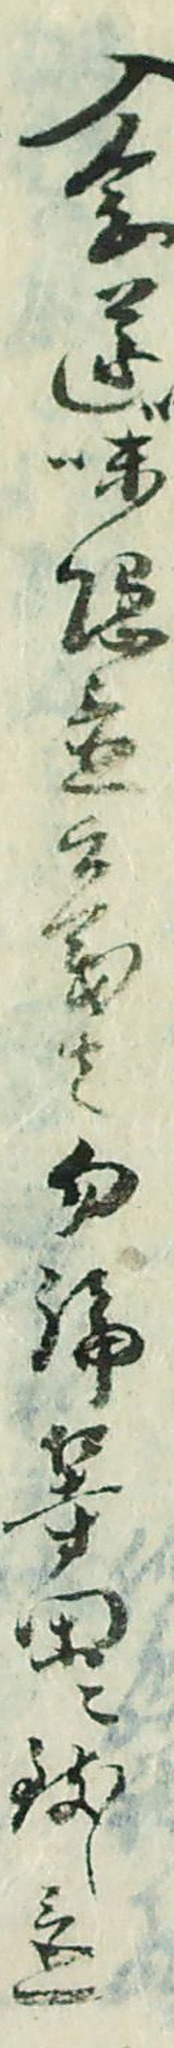入念遂吟味隠置候義は勿論等閑に致し置
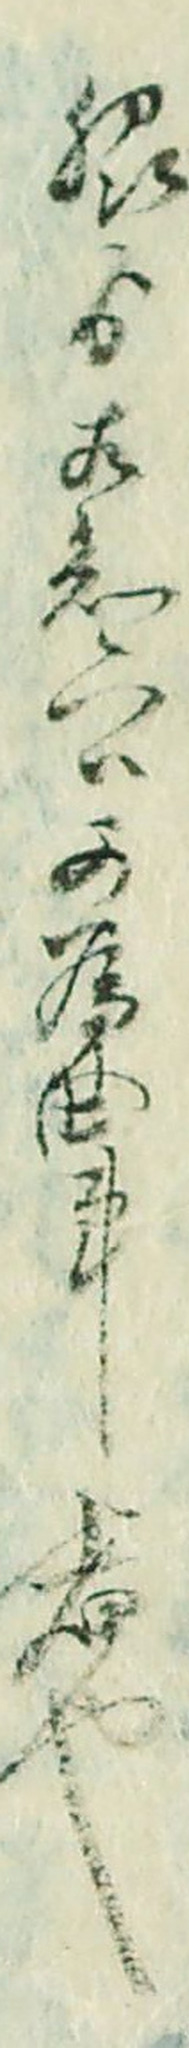脇ゟ相知候へは可為曲事者也
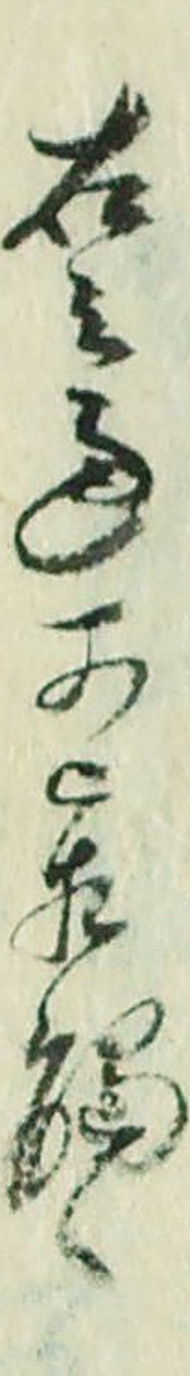右之通可被相触候
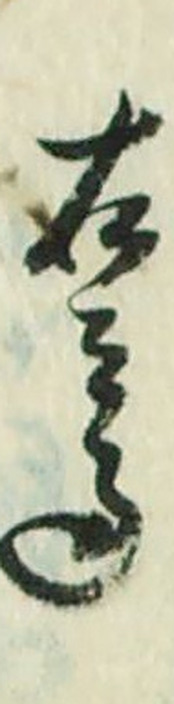右之通
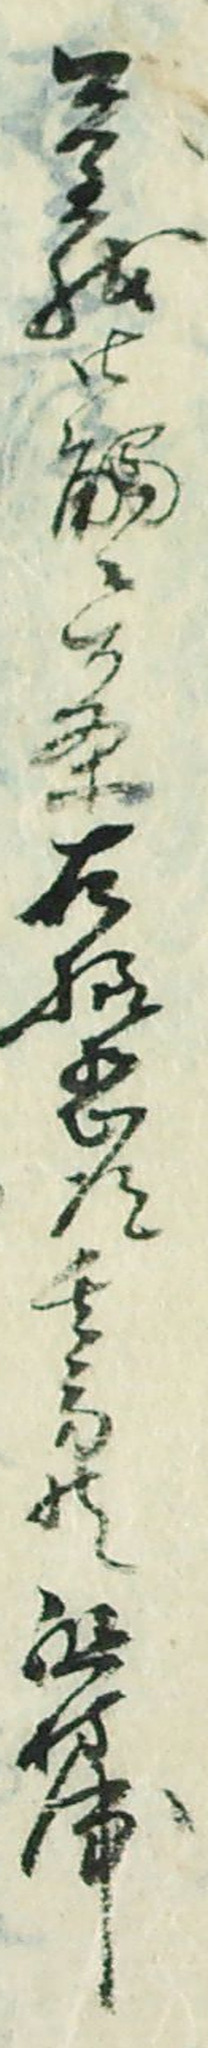公義御触に候条右様相心得其方共組村浦
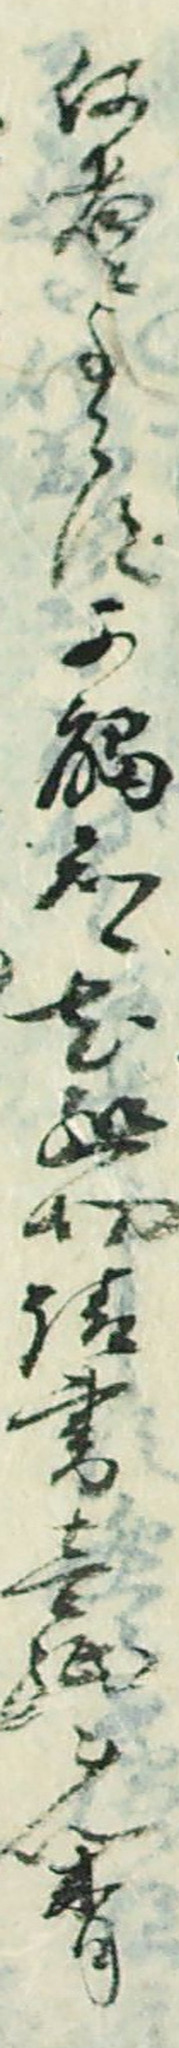何者によらす可触知候尤組切請書壱紙を以来月
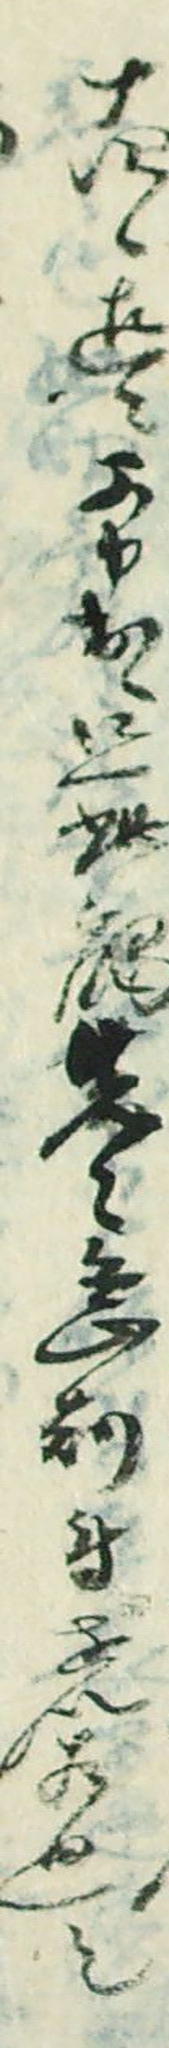十四日迄に可申出候且此触先々急刻付を以相廻し
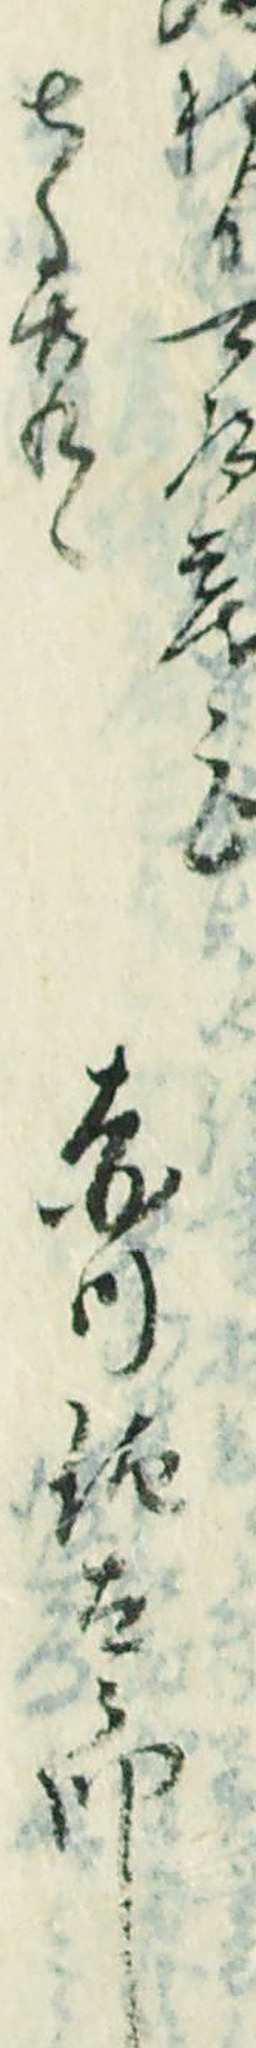七月廿九日赤川佐太郎

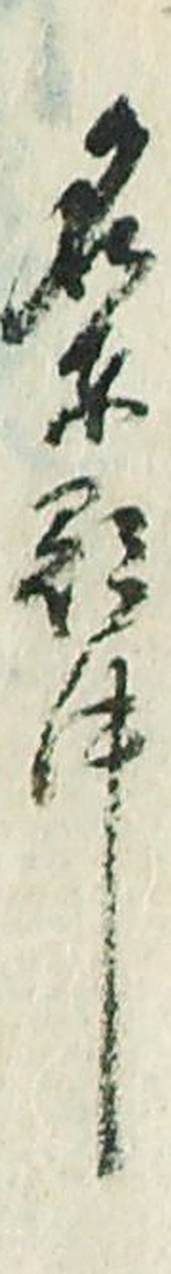名東郡中
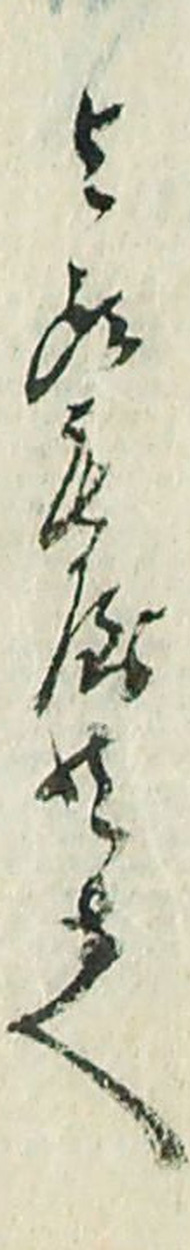与頭庄屋共方へ
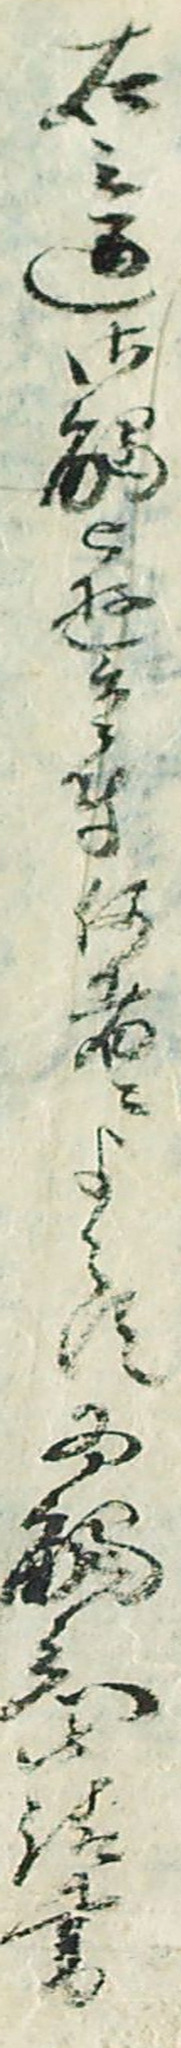右之通御触被遊候に付何者によらす為触知御請書
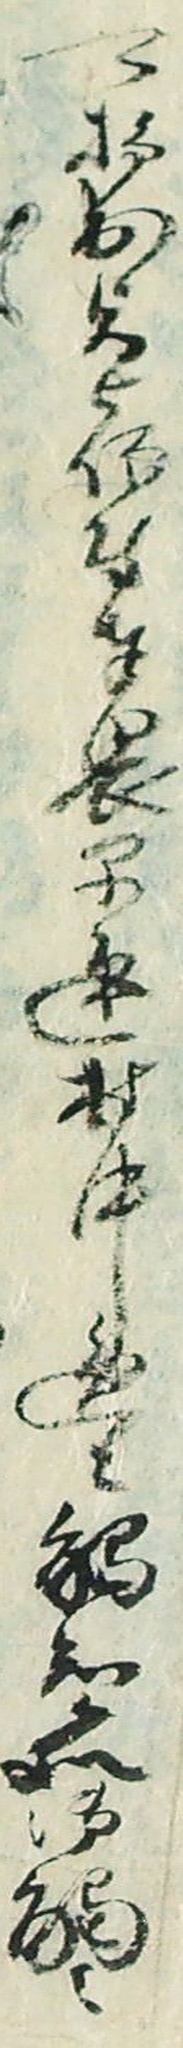可指出旨被仰付奉畏候早速村中逸々触知候処御触之
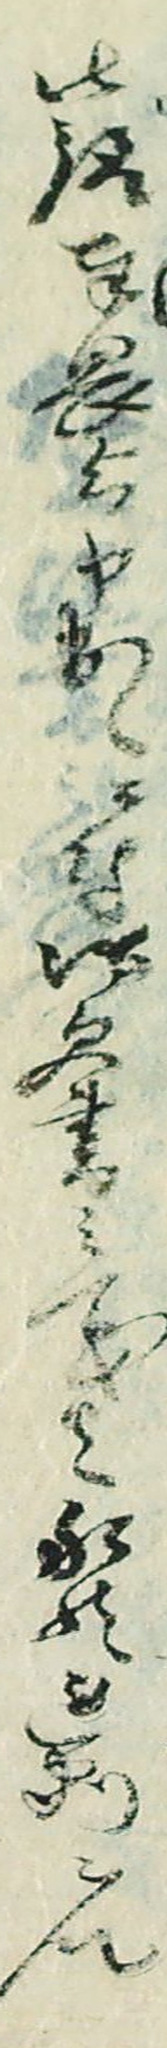御趣奉畏旨申出候に付御受書之義は私共連判を以
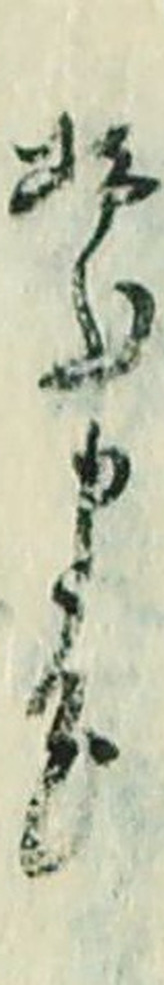指上申候以上
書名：諸御用御□受書控
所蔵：鳴門教育大学 Naruto University of Education
